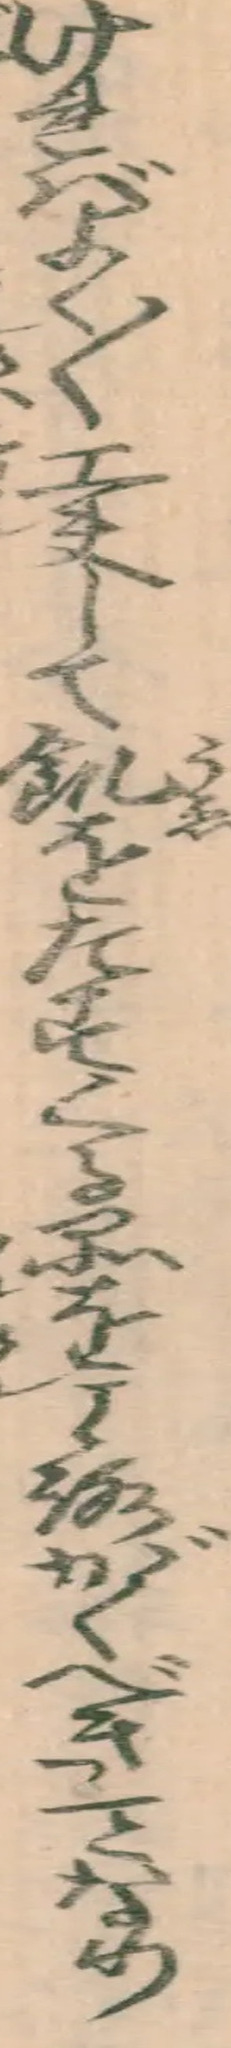ければよく〳〵工夫して飢をたすくる品をこゝろがくべきことなり
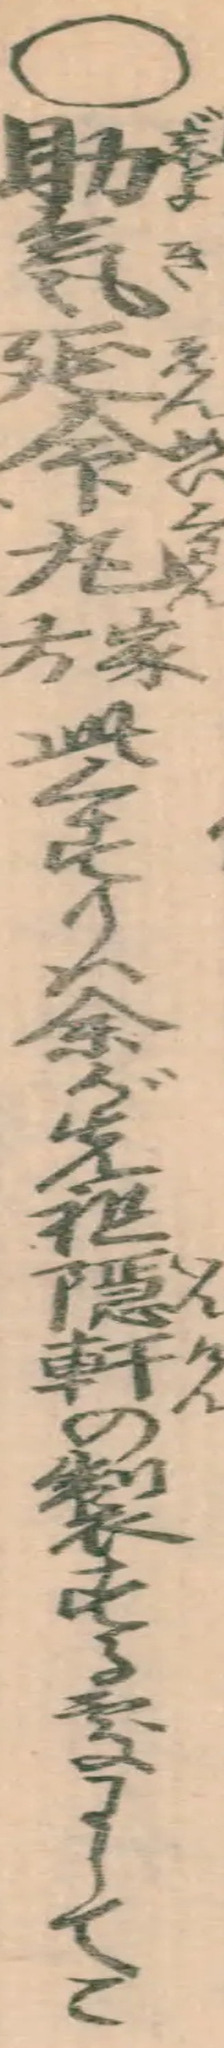○助気延命丸家方此くすりは余が先祖隠軒の製する処にしてこ
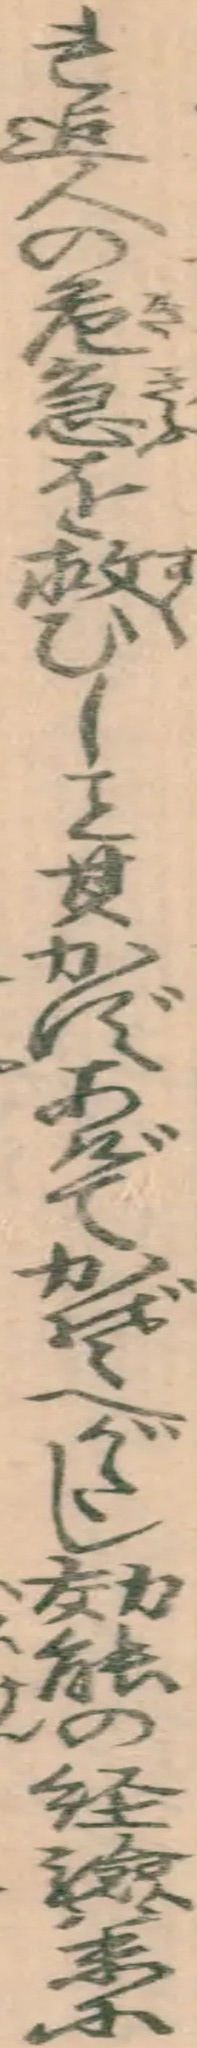れ迄人の危急を救ひしこと其かずあげてかぞへがたし効能の経験末に
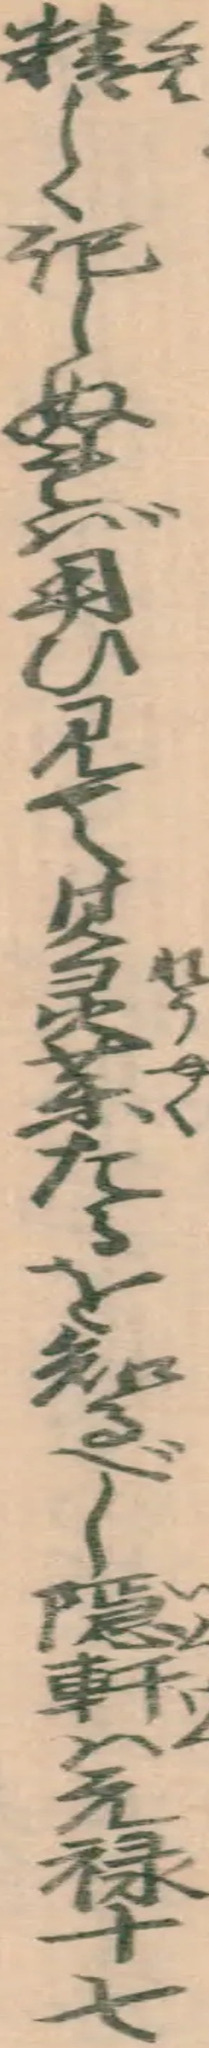精しく記しぬれば用ひ見て其霊薬たるを知るべし隠軒は元禄十七
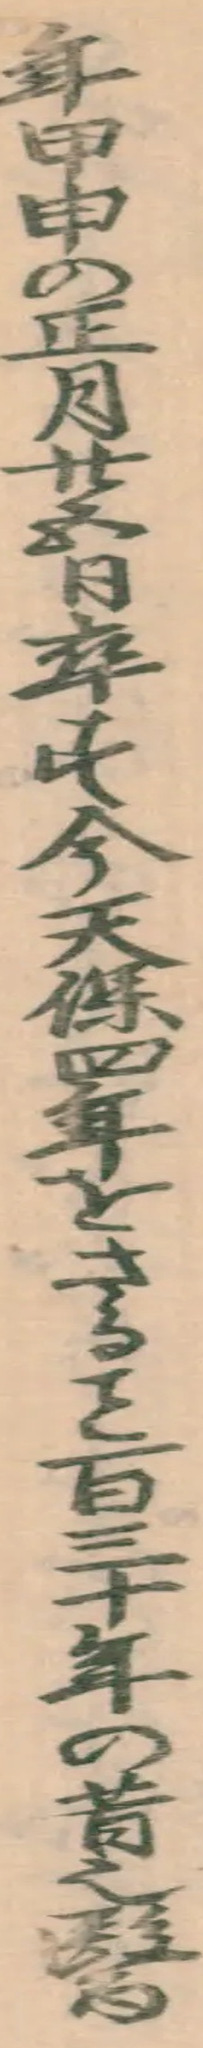年甲申の正月廿五日卒す今天保四年をさること百三十年の昔也医
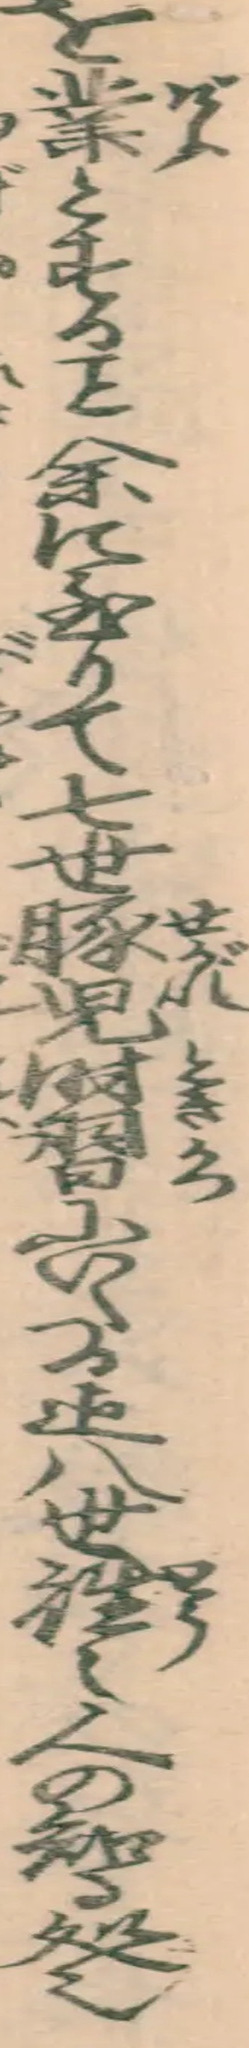を業とすること余に至りて七世豚児時習にいたる迄八世往々人の知る処也
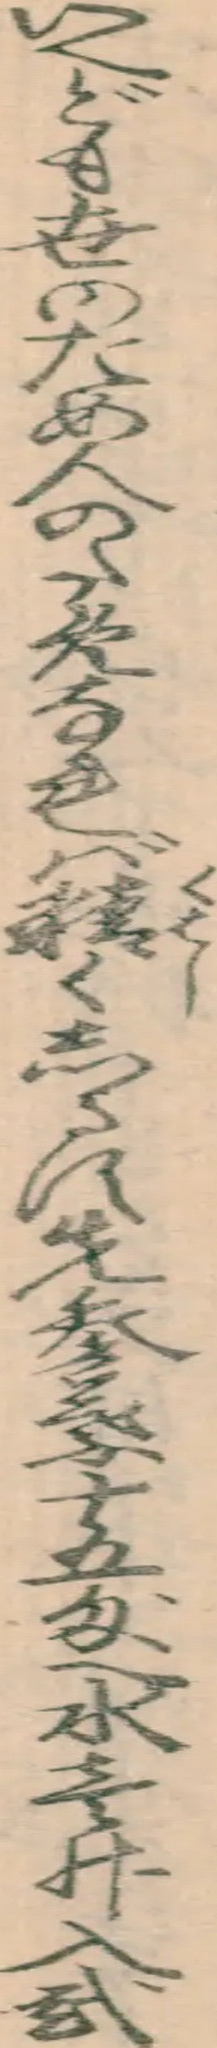いへども世のため人のためなれば精くしるす先参葉十五匁へ水壱升入弐
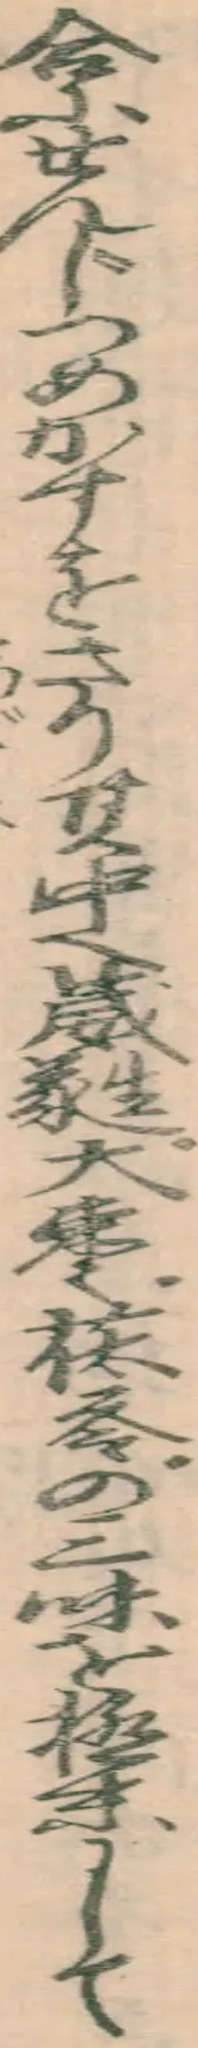合にせんじつめかすをさり其中へ崴甤．大棗．茯苓．の三味を極末にして
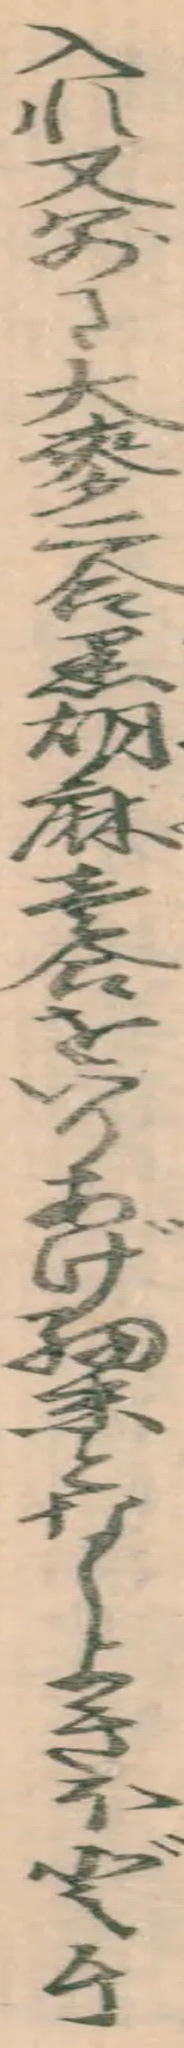入れ又別に大麦二合黒胡麻壱合をいりあげ細末となしよきほどに
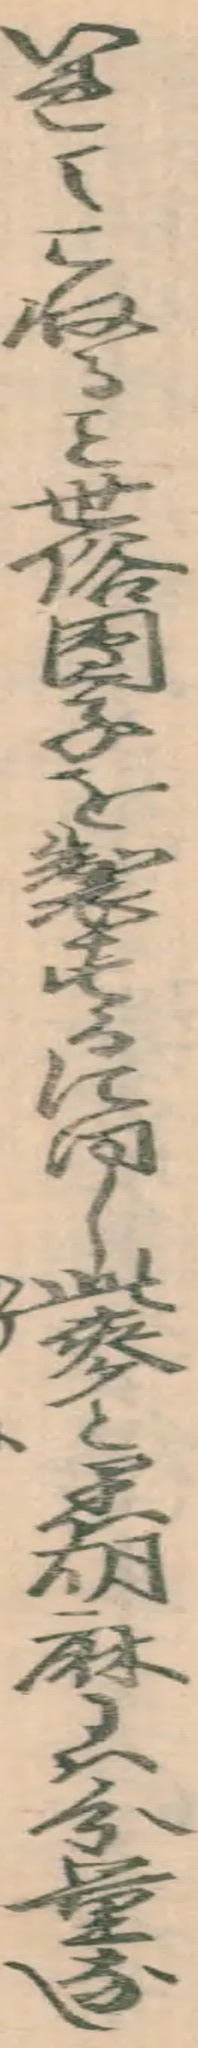いれてこねること世俗団子を製するに同し此麦と黒胡麻には分量なし
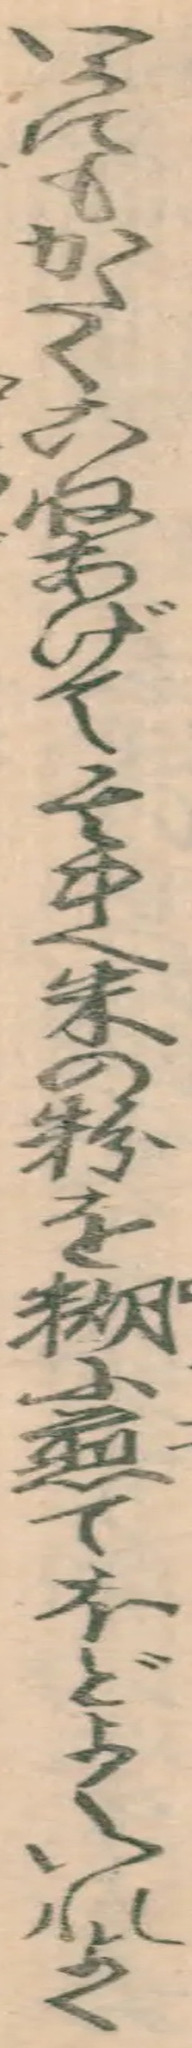いかにもかたくこねあげて其中へ米の粉を糊に煎てほどよくいれよく
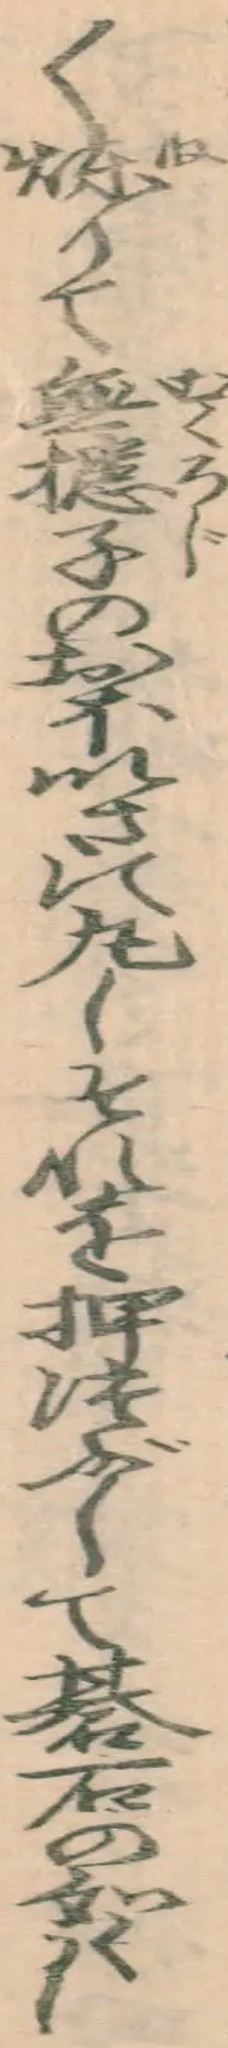〳〵煉りて無槵子のおほいさに丸しそれを押つぶして碁石の如くし
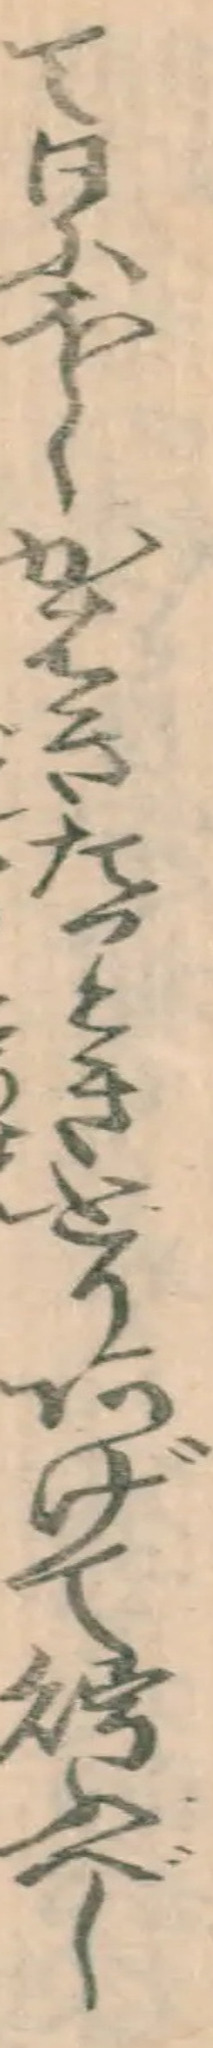て日にほしかはきたるときとりあげて貯ふべし
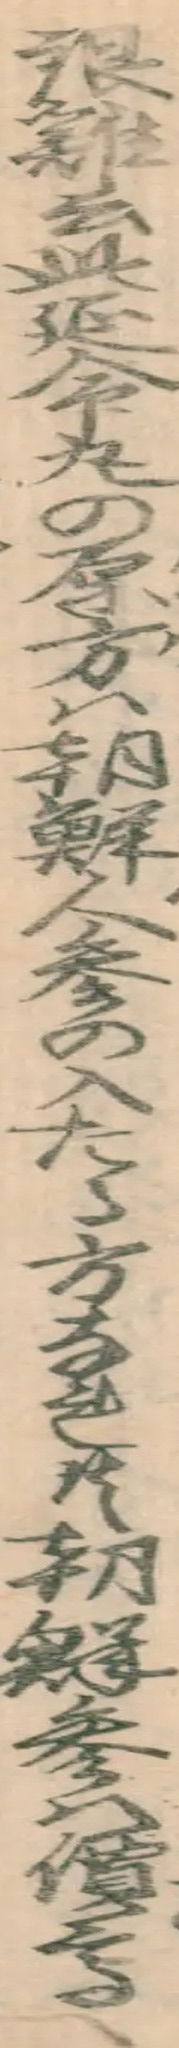銀雞云此延命丸の原方は朝鮮人参の入たる方なれ共朝鮮参は價高
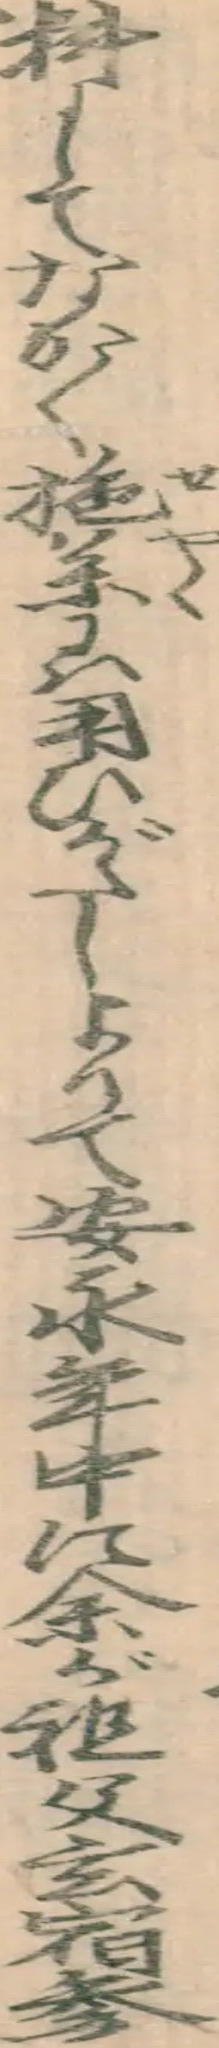料にしてなか〳〵施薬には用ひがたしよりて安永年中に余が祖父玄宿参
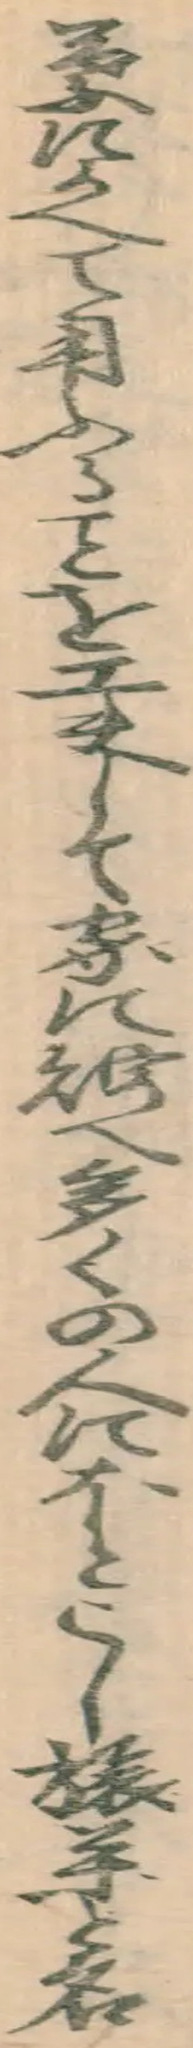葉にかへて用ふることを工夫して家に貯へ多くの人にほとこし旅薬と名
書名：日ごとの心得
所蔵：国立国会図書館 National Diet Library, JAPAN
